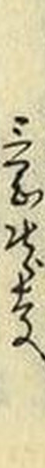三岡次郎太夫
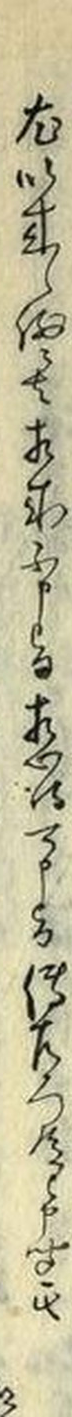尤以来之儀ニ者相成不申旨相心得可申旨伝左衛門殿被申聞其
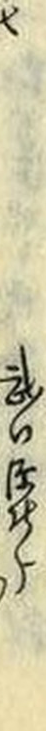武田源次郎
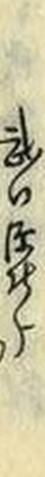武田源次郎
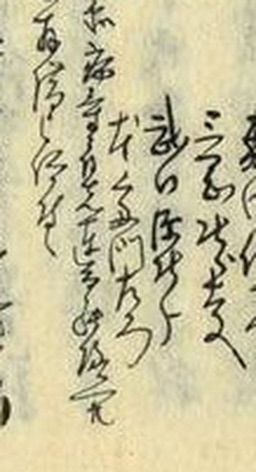本多門左衛門
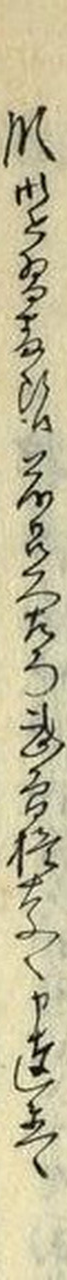段御近習番頭取茂呂久左衛門武曾権太夫へ申達置候
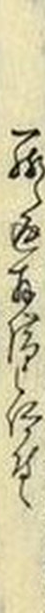一統之通拝借被仰付候
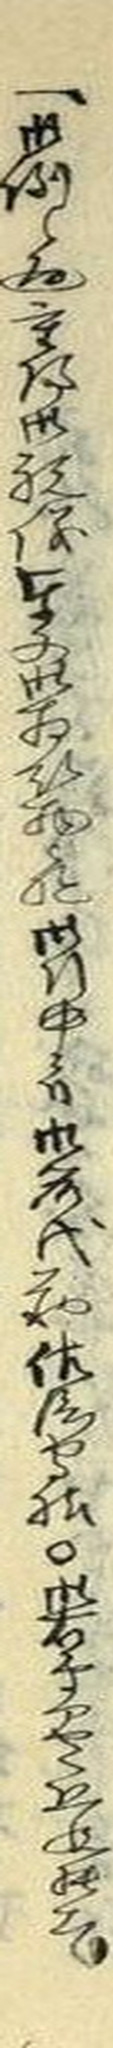一御例之通重陽御祝儀奉文御拝領被遊御引中ニ付御名代勤佐渡守様〇御右筆部屋へ恐悦罷出候
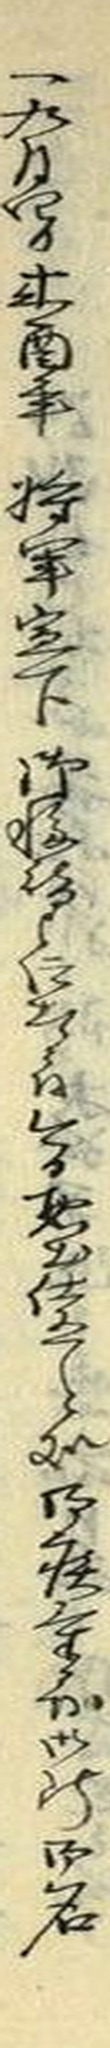一九月四日来酉年将軍宣下御移替被仰出候ニ付今日惣出仕有之候処御疾気ニ付御断御名
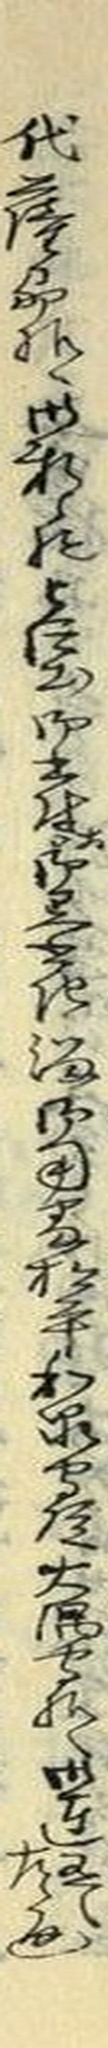代薩州様へ御頼被遊被仰出御書付於御黒書院溜御用番松平和泉守殿大隅守様へ御達有之左之通
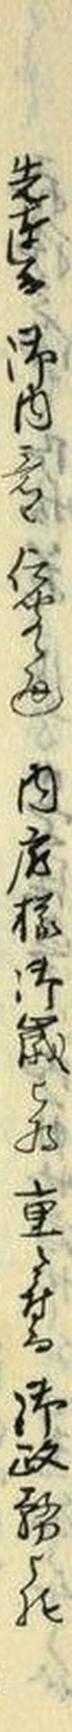先達而御内意被仰聞候通内府様御歳被為重候ニ付而御政務被遊
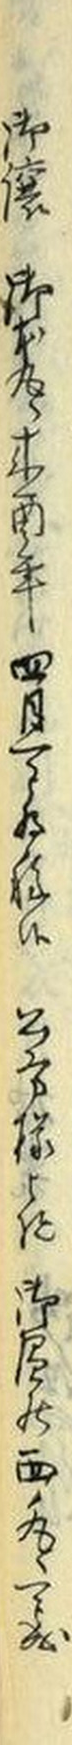御譲御本丸へ来酉年四月可被為移候公方様被遊御隠居西ノ丸へ可被成
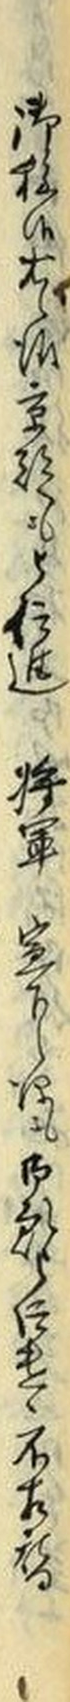御移候右之趣京都へも被仰進将軍宣下之儀も御願被仰遣候不相替
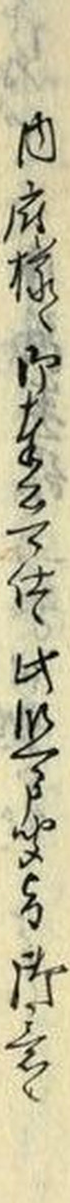内府様へ御奉公可仕候此段可申聞旨御意候
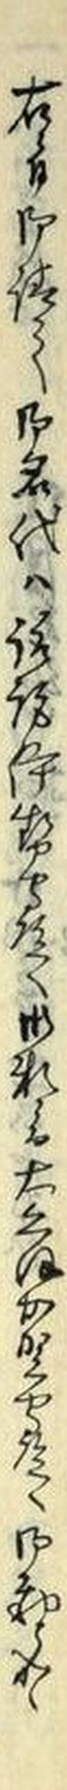右ニ付御請之御名代ハ諏訪伊勢守殿へ御頼ニ而大久保加賀守殿へ御勤被成候
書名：少傅日録抄（斉善付側向頭取日記、在府）
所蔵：福井県文書館 Fukui Prefectural Archives
